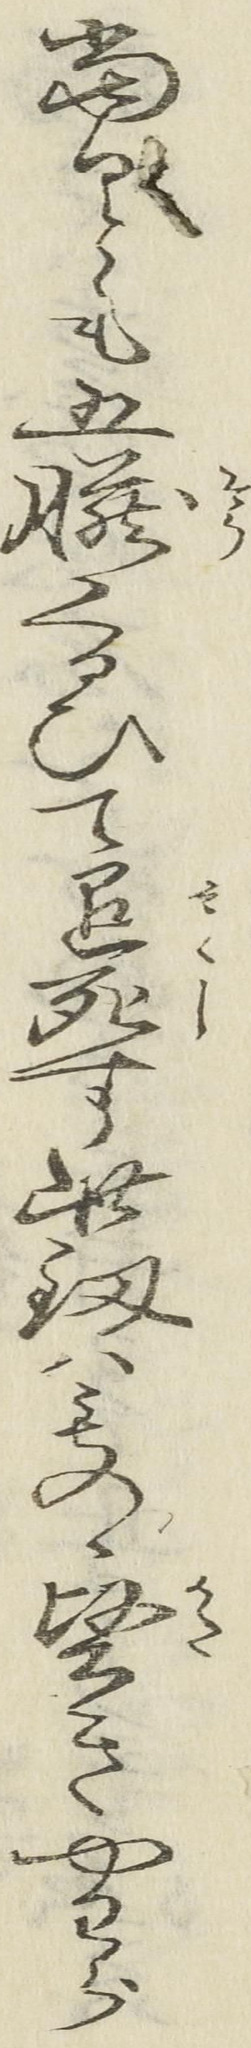当るとも五臓くるひて即死す此釼はものゝの堅きやわら
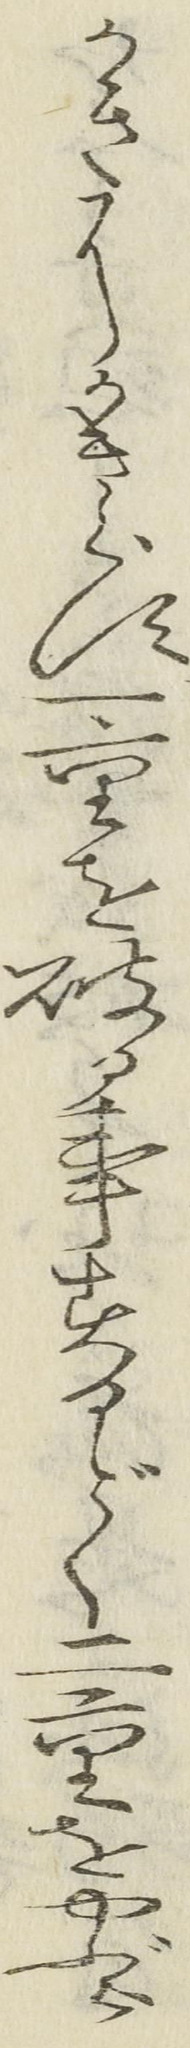かきにかきらす一重を破る事するどく二重をやぶら
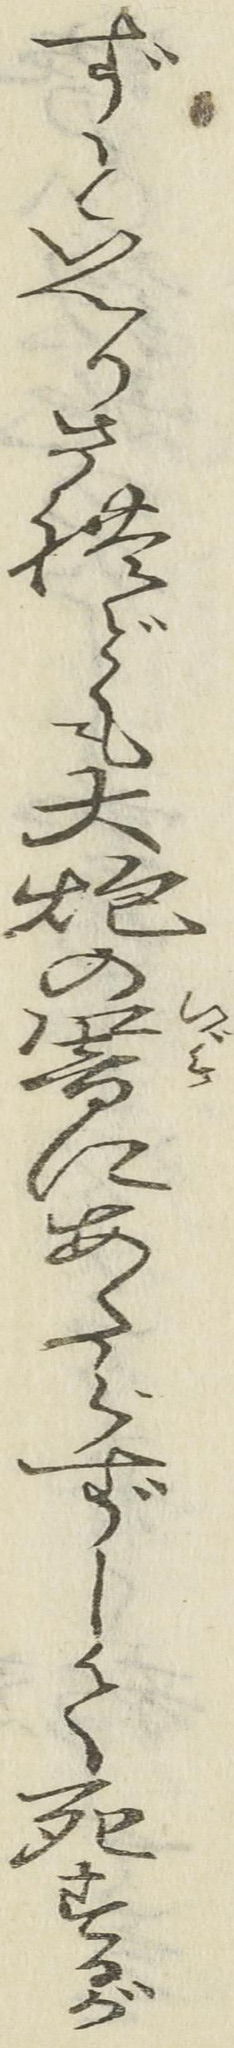ずといへりされども大砲の響にあたらずして死するが
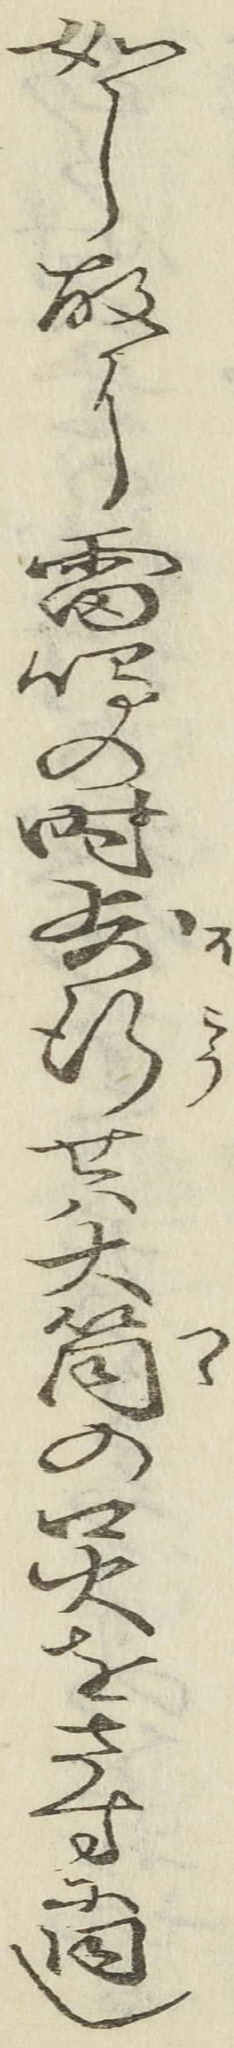如し故に雷鳴の時歩行せは大筒の口火をさすに同し
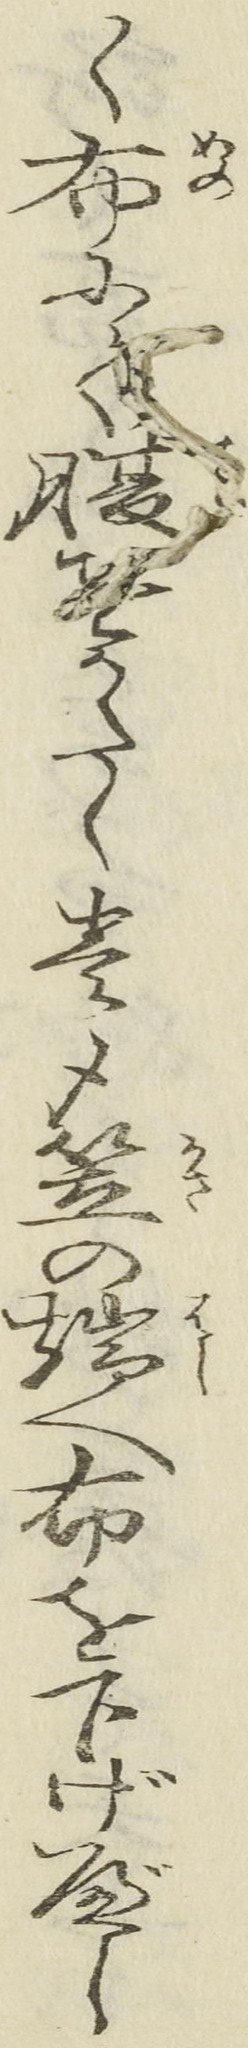く布にて腹巻かたく巻〆笠の端へ布を下げべし
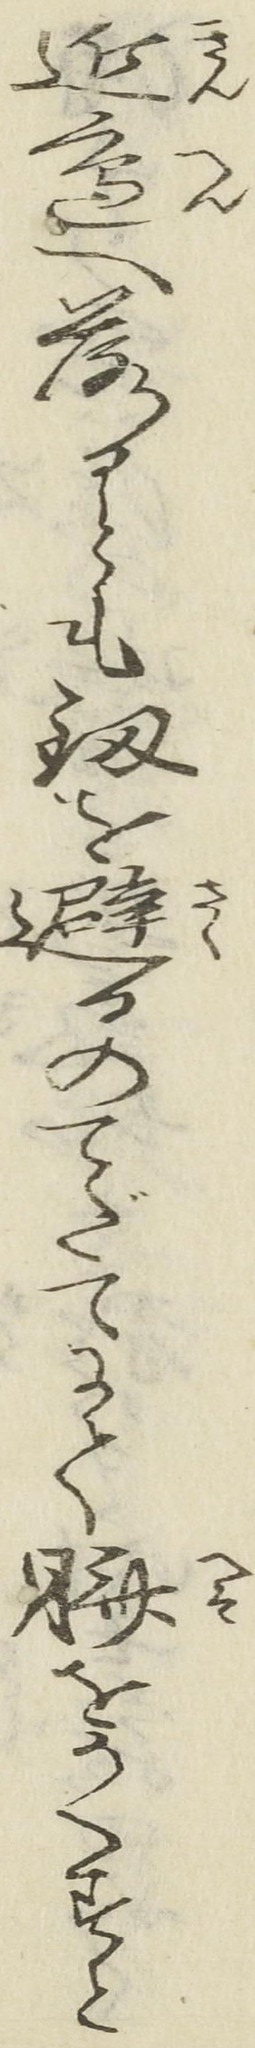近辺へ落るとも釼を避るのてだてにて臍をかくすと
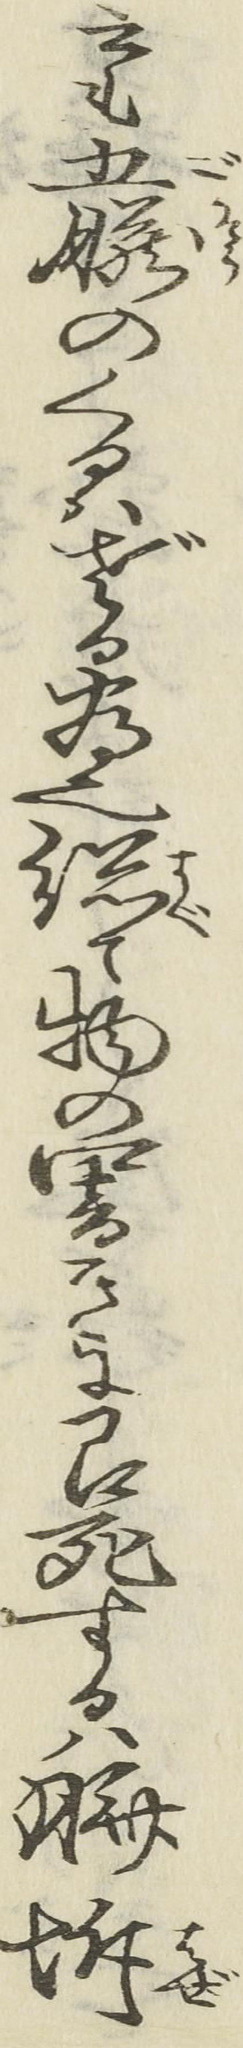云も五臓のくるはざる為也総て物の響きに即死するは臍坼
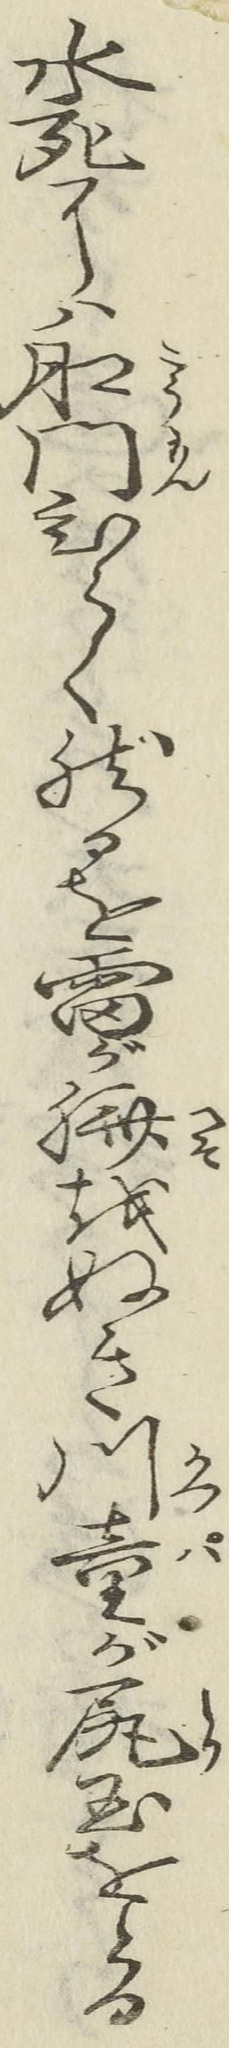水死には肛門ひらく然るを雷が臍をぬき川童が尻玉をとる
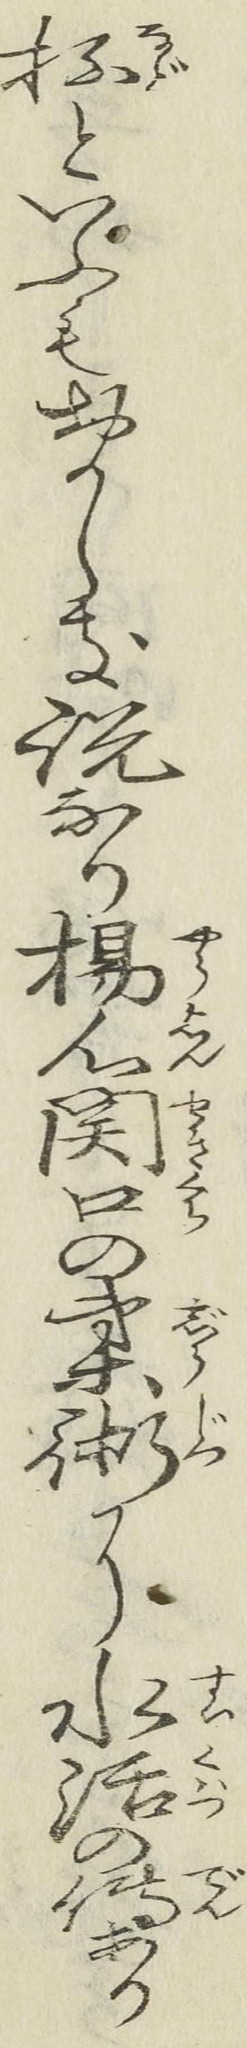杯といふもおかしき説なり楊心関口の柔術に水活の傳あり
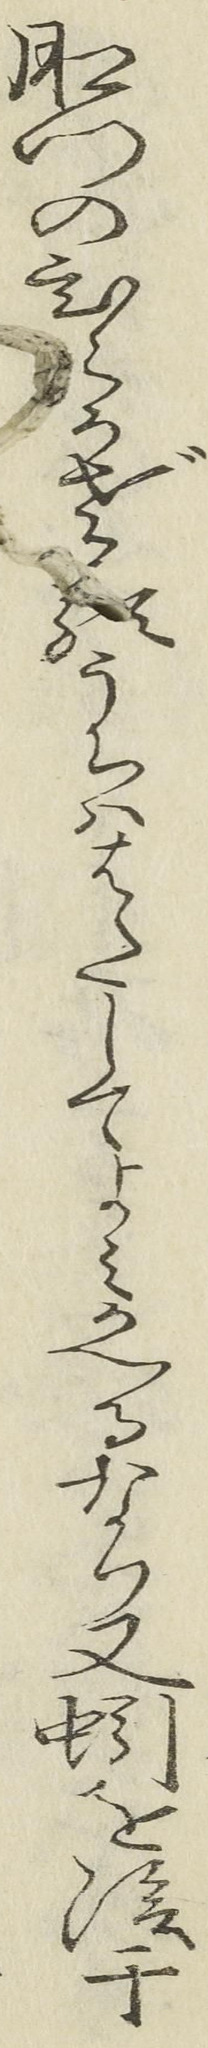肛門のひらかざるうちははたしてよみかへるなり又蚓を陰干
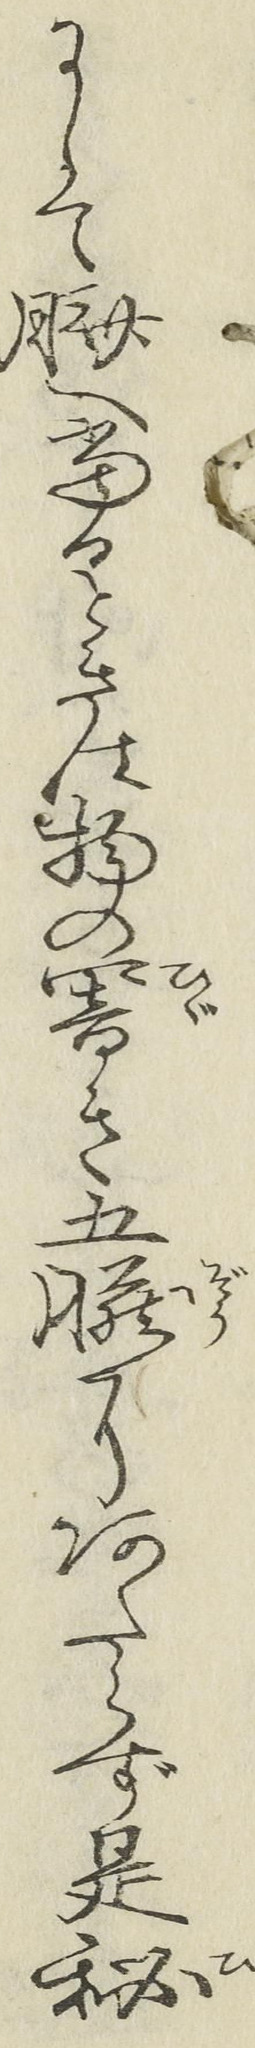にして臍に当るときは物の響き五臓にあたらず是秘
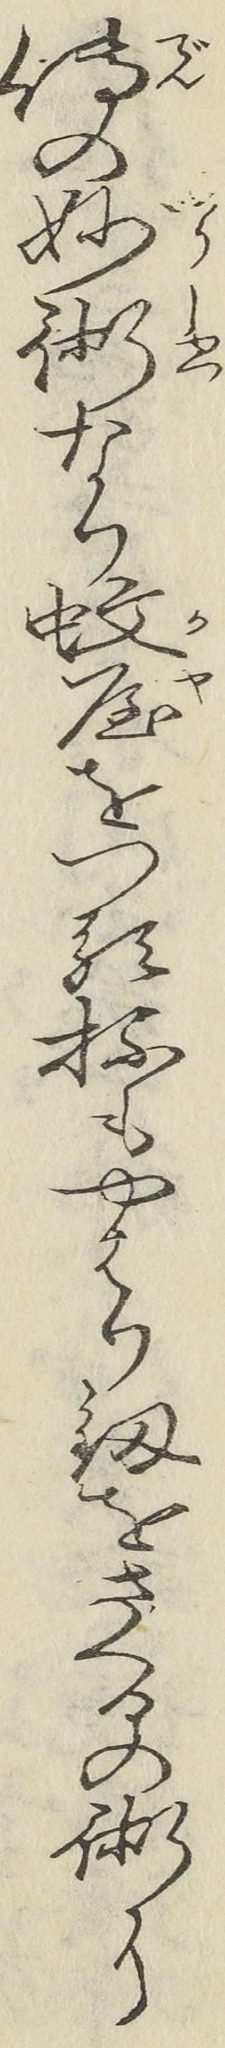傳の妙術なり蚊屋つる杯もやはり釼をさくるの術に
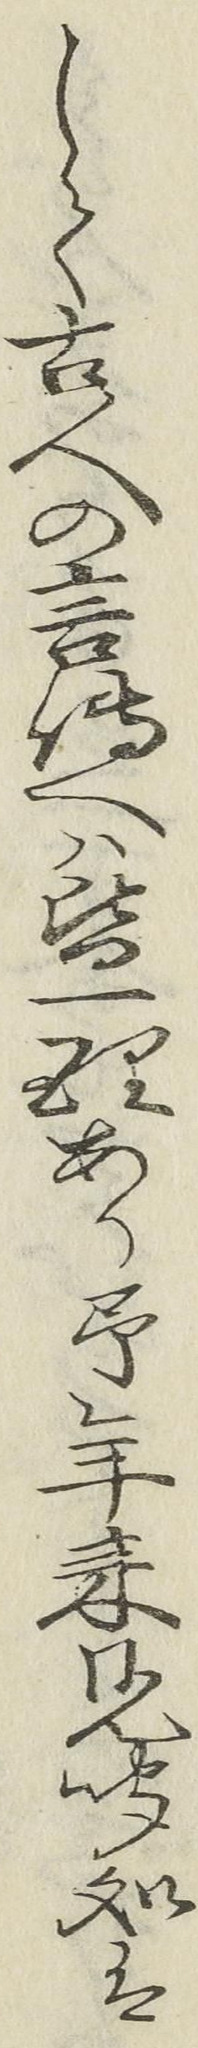して古人の言伝へは皆一理あり予年来見聞処は
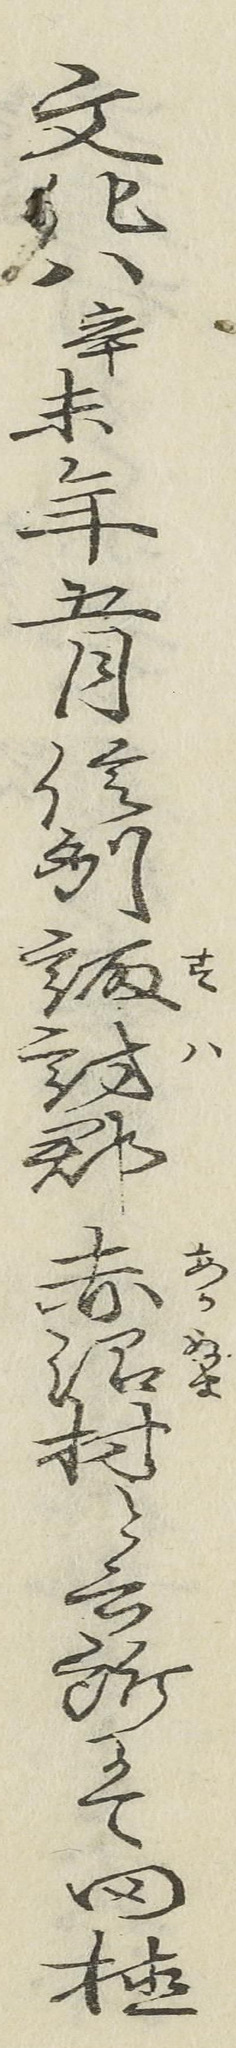文化八辛未年五月信州諏訪郡赤沼村と云所にて田植
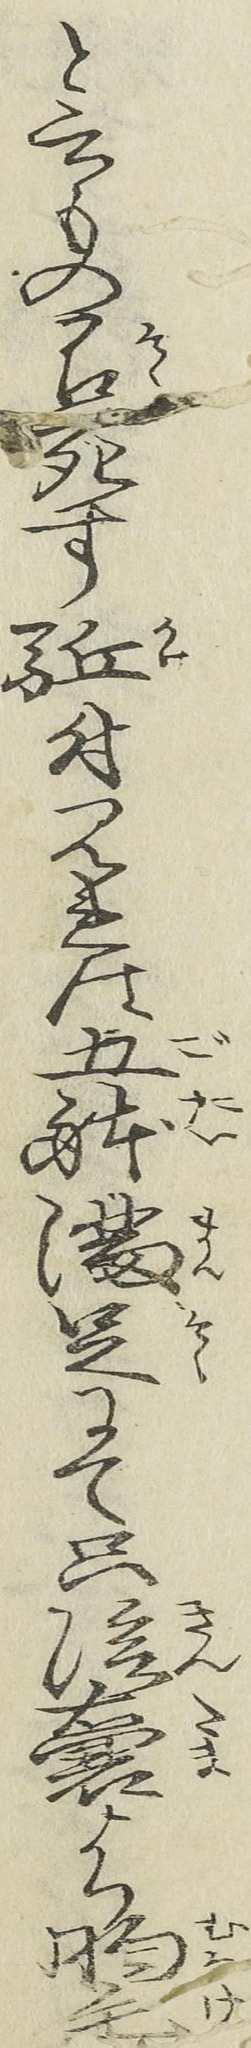と云もの即死す駆付見れは五躰満足にて只陰嚢より胸毛

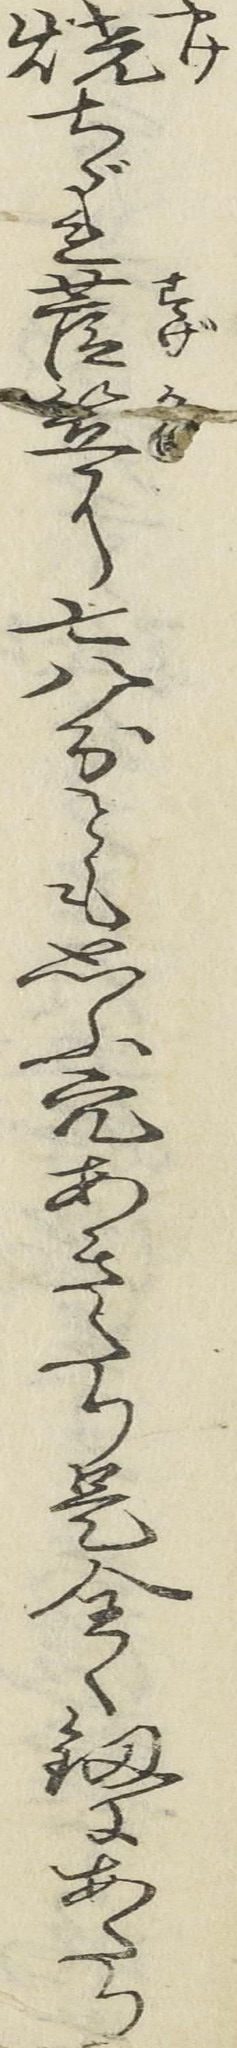焼ちゞれ菅笠に七八分とも思ふ穴あきたり是全く釼にあたり
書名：震雷考説　全
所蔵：東京大学地震研究所図書室 Earthquake Research Institute Library, The University of Tokyo, JAPAN
